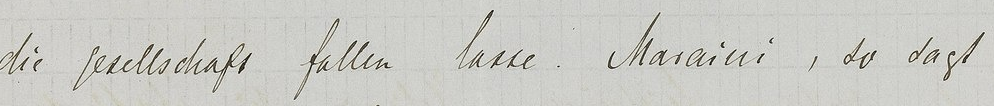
die Gesellschaft fallen lasse. Maraini, so sagt
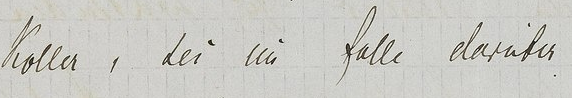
Koller, sei im Falle darüber
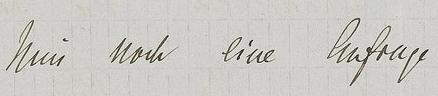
Nun noch eine Anfrage,
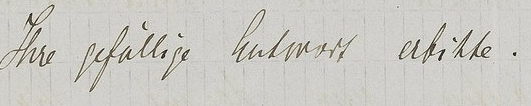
Ihre gefällige Antwort erbitte.
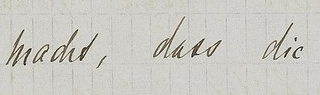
macht, dass die
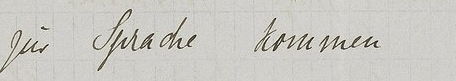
zur Sprache kommen könne.
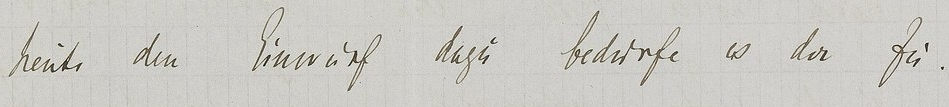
heute den Einwurf dazu bedürfe es der Zu-
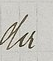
festen
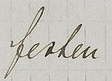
Ihrige
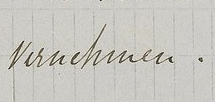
vernehmen.
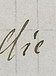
Ihr
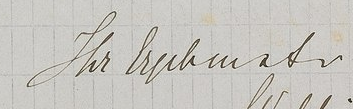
Ergebenster
